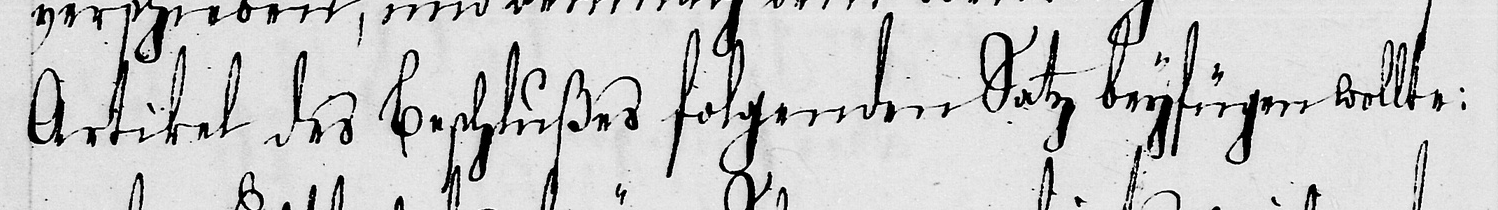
Artikel des Beschlußes folgenden Satz beyfügen wollt¬
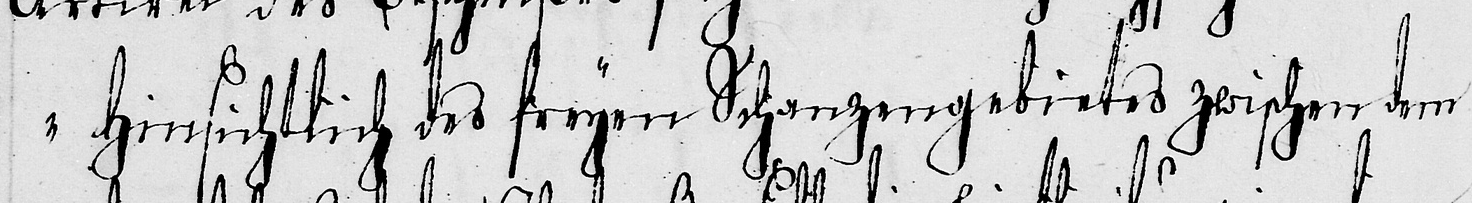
„Hinsichtlich des freyen Schanzengebietes zwischen dem
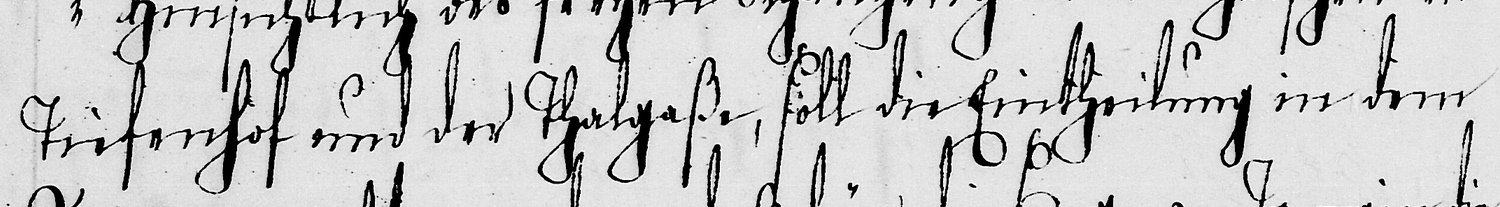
Tiefenhof und der Thalgaße, soll die Eintheilung in
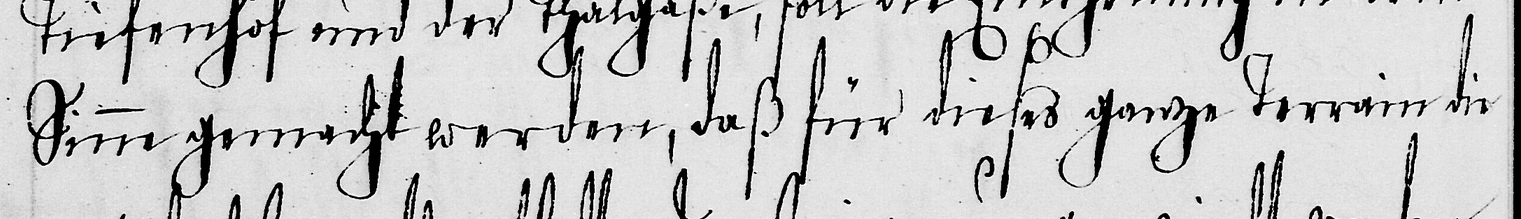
Sinne gemacht werden, daß für dieses ganze Terrain die
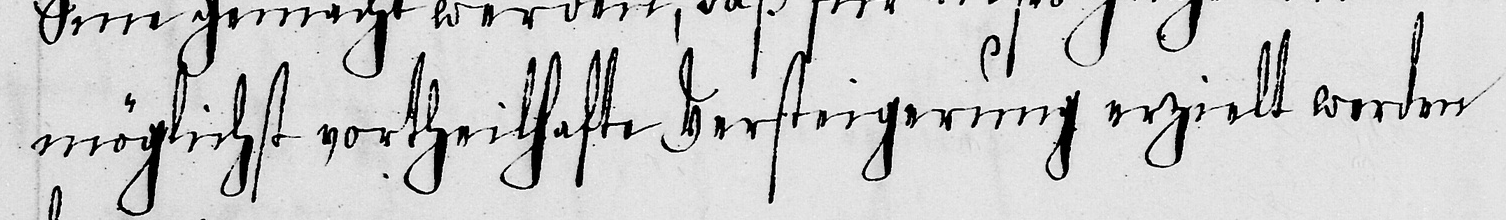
möglichst vortheilhafte Versteigerung erzielt werden
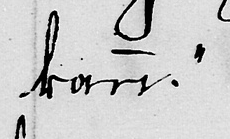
kann.“
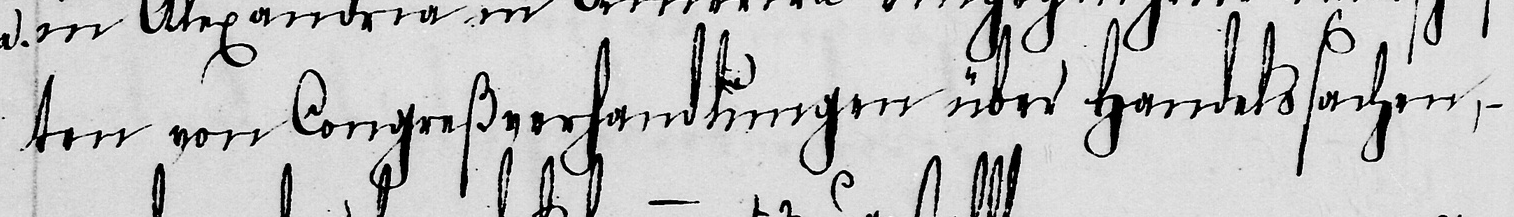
ften von Congreßverhandlungen über Handelssachen,
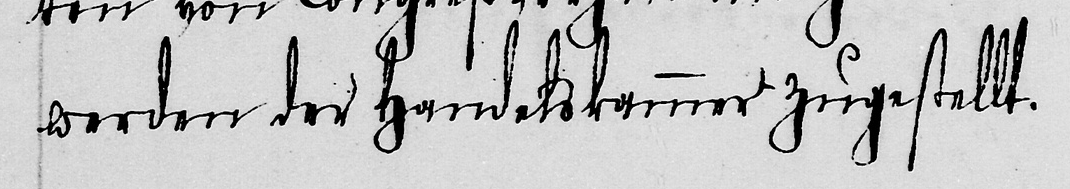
werden der Handelskammer zugestellt.
